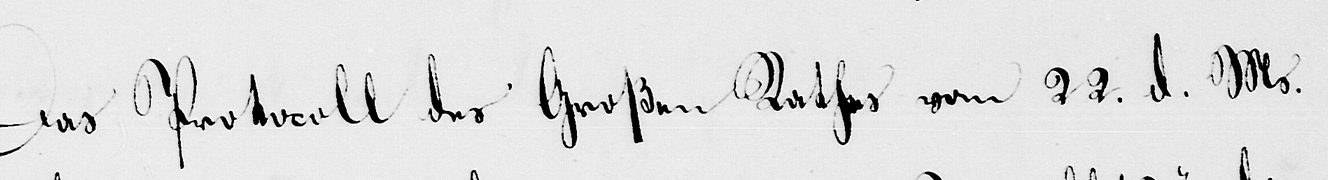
Das Protocoll des Großen Rathes vom 22. d. Ms.
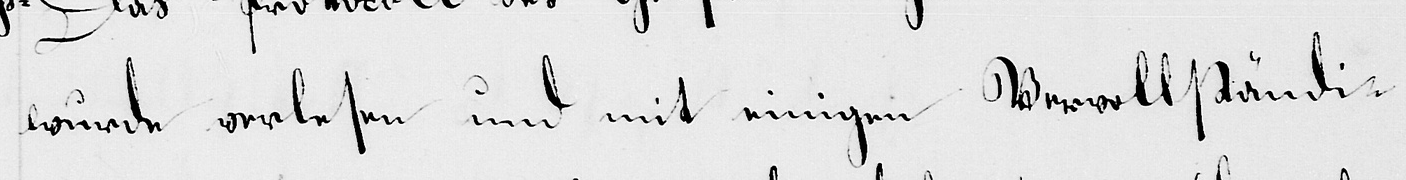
wurde verlesen und mit einigen Vervollständi¬
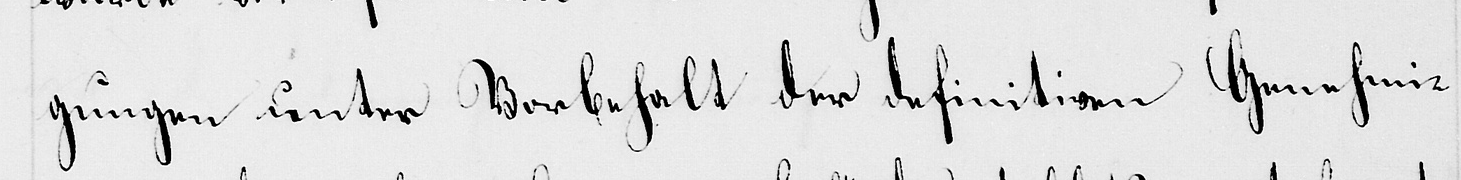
gungen unter Vorbehalt der definitiven Genehmi¬
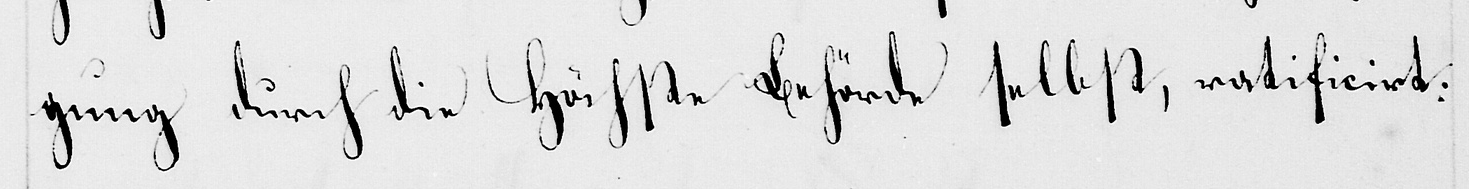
gung durch die Höchste Behörde selbst, ratificirt.
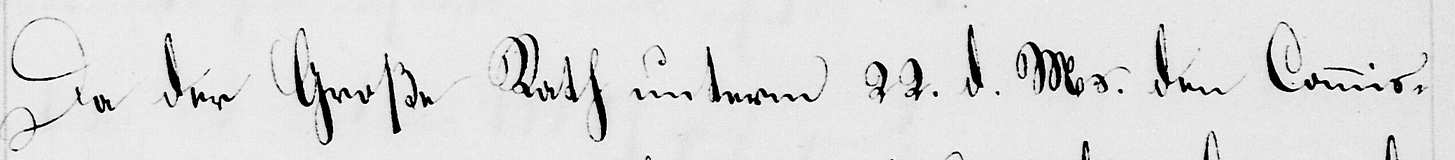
Da der Große Rath unterm 22. d. Ms. den Commis¬
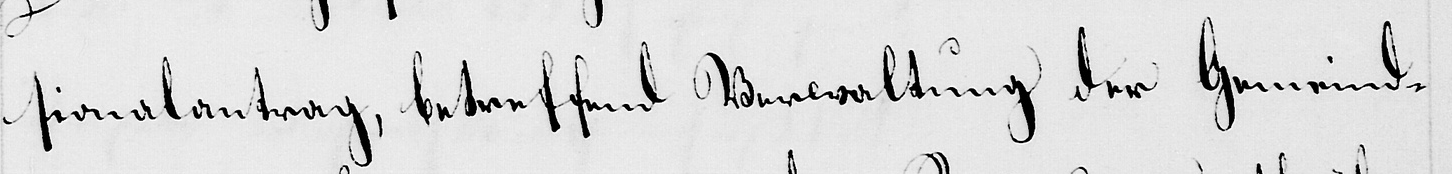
sionalantrag, betreffend Verwaltung der Gemeind¬
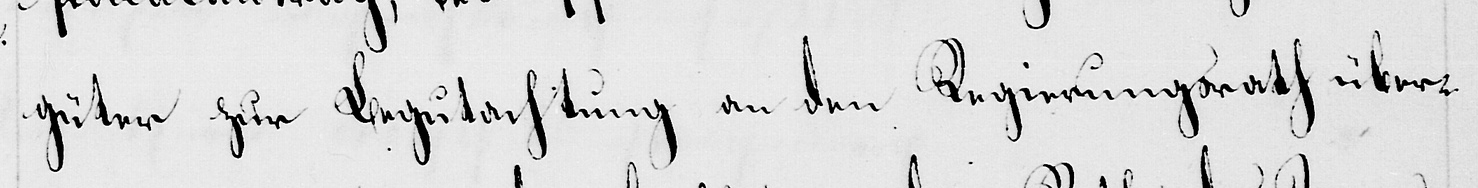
güter zur Begutachtung an den Regierungsrath über¬
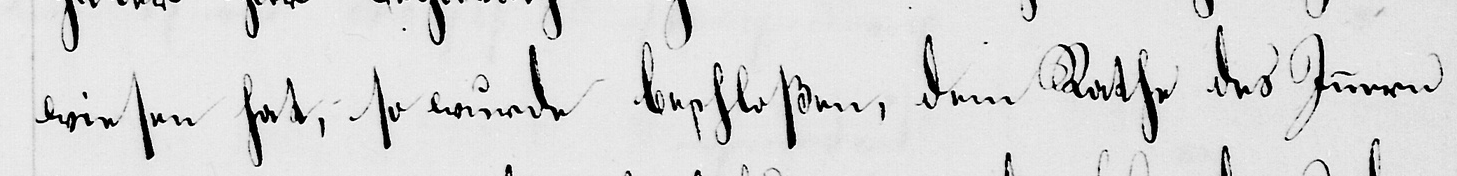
wiesen hat, so wurde beschloßen, dem Rath des Innern
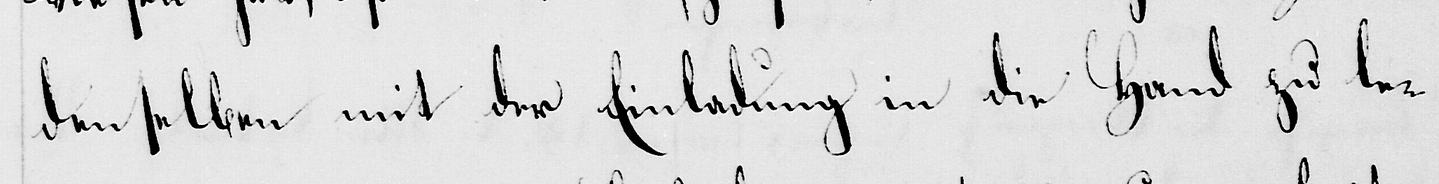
denselben mit der Einladung in die Hand zu le¬
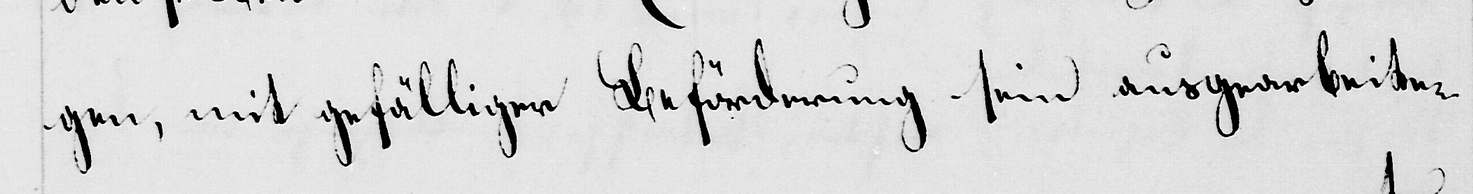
gen, mit gefälliger Beförderung sein ausgearbeite-
